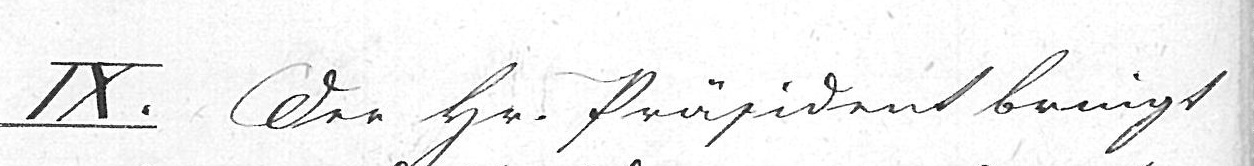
IX. Der Hr. Präsident bringt
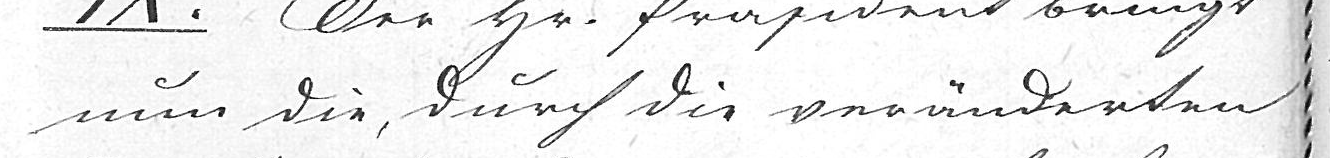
nun die, durch die veränderten
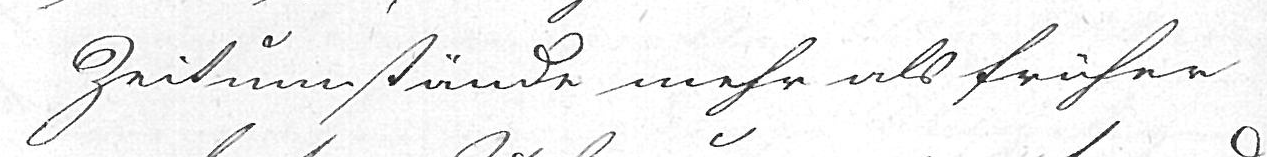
Zeitumstände mehr als früher
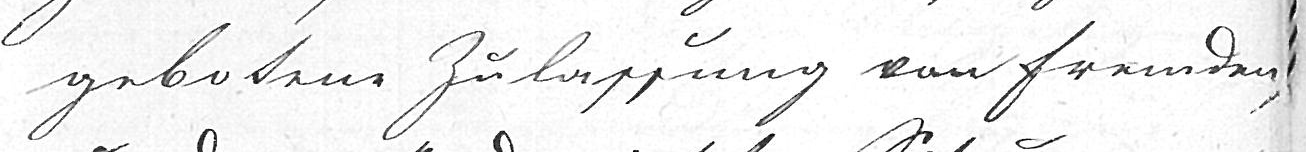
gebotene Zulassung von Fremden
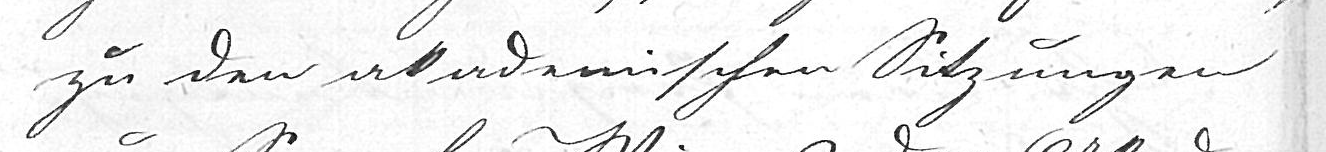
zu den akademischen Sitzungen
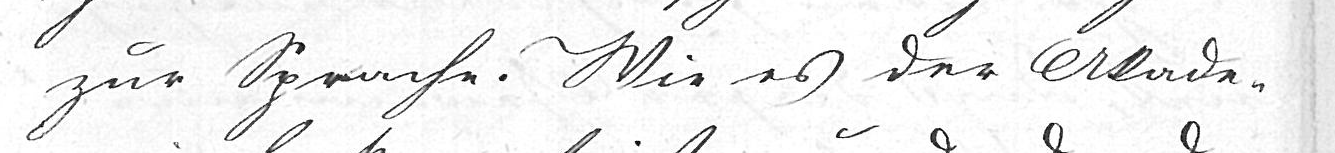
zur Sprache. Wie es der Akade-
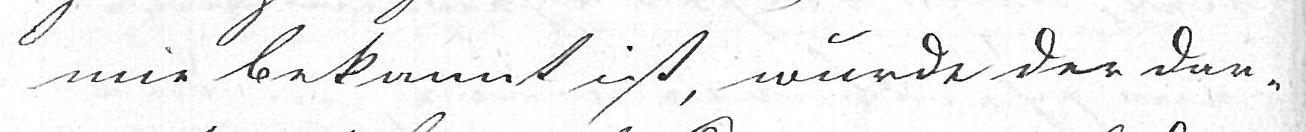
mie bekannt ist, würde der dar-
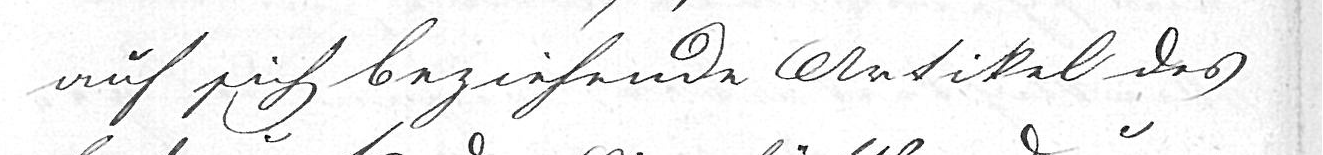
auf sich bezuehende Artikel des
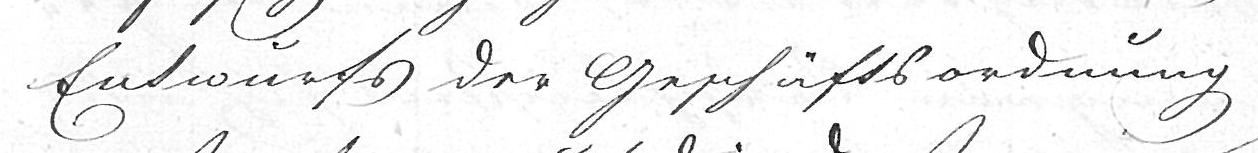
Entwurfs der Geschäftsordnung
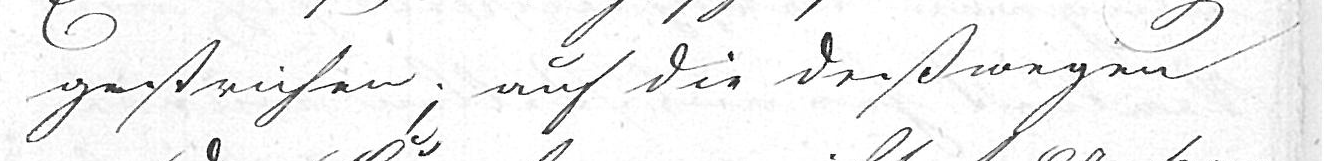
gestrichen; auf die deßwegen
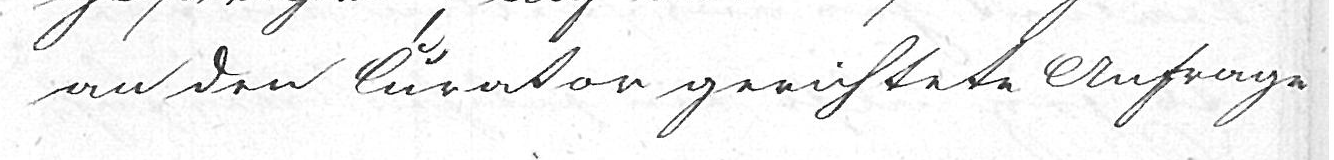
an den Curator gerichtete Anfrage
